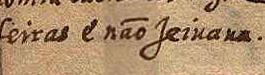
feiras e não Jeiuaua.
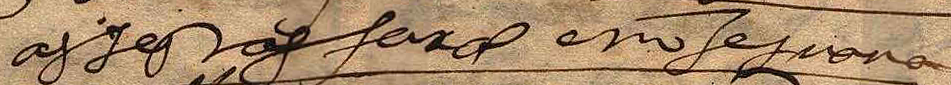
as sestas feiras e nō Jejuaua
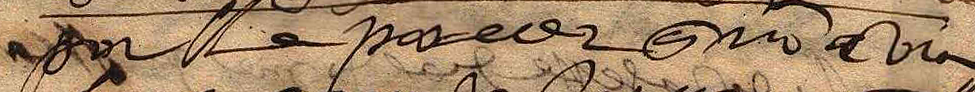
por lhe parecer q̄ nō avia
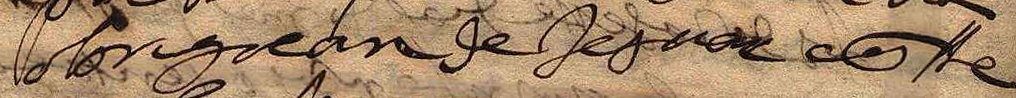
obrigaçam de Jejuar e q̄ lhe
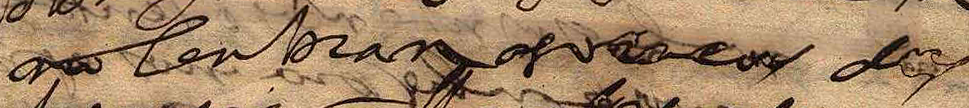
nō lenbram as oraçois dos
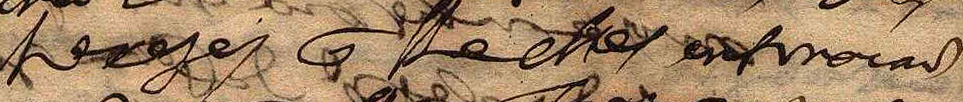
herejes q̄ lhe elles ensinaraõ
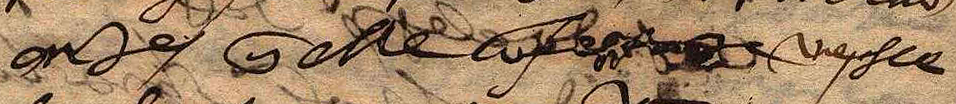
antes q̄ elle cōfessante vyesse
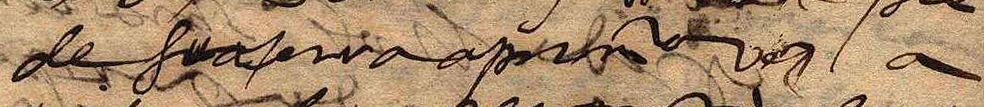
de sua terra a primra vez a
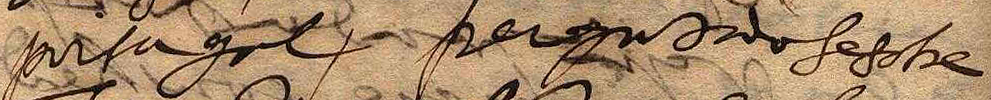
portugal / pergūtado se sabe
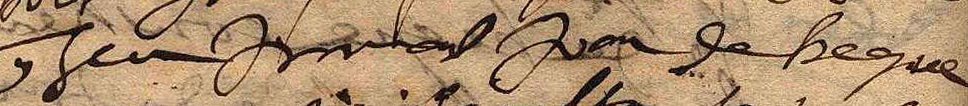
q̄ seu Jrmaõ Joam de beque
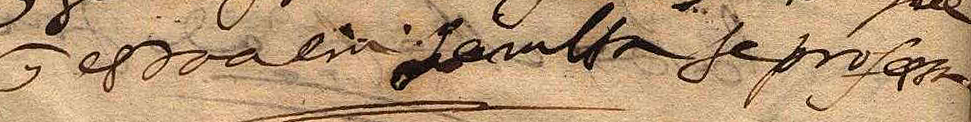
q̄ estaa em seuilha se professa
